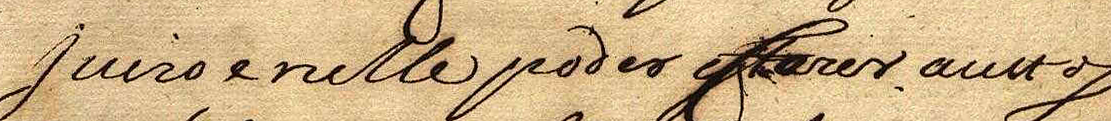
juizo, e nelle poder fazer auttos
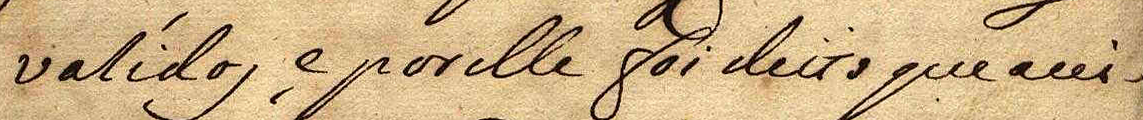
validos, e por elle foi ditto que acei
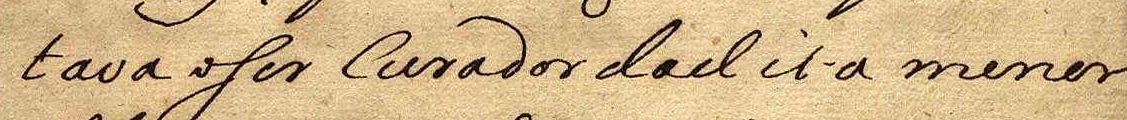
tava o ser Curador da dita menor
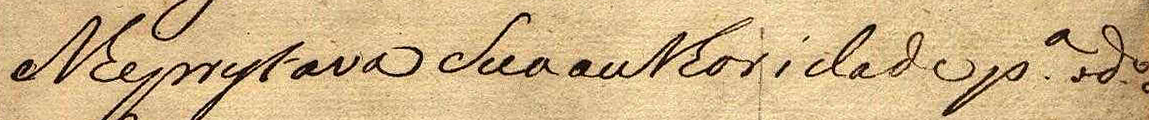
e lhe prestava Sua authoridade p.a o d.o
